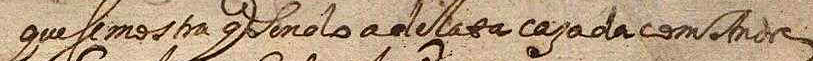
que se mostra q̄ sendo a delata casada com Andre
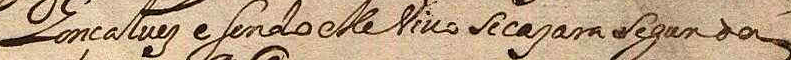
Gonçalvez e sendo elle Viuo se cazara segunda
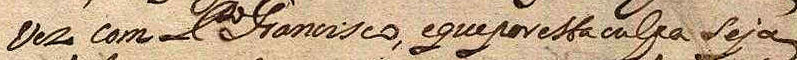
vez com P.o Francisco, e que por esta culpa seja
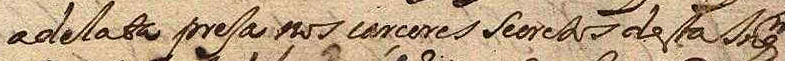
a delata preza nos carçeres secretos desta Inq.m
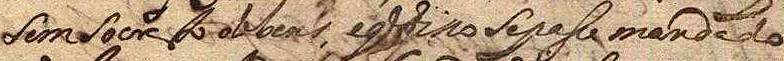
sem socresto de bens, e q̄ disso se passe mandado
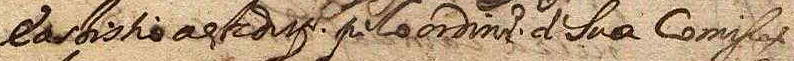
& assistio a este desp. pelo ordinr.o de Sua Comissaõ
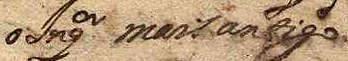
o Inq.or mais antigo.
